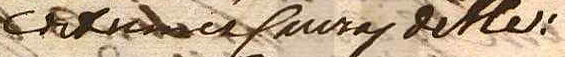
costume e Cauzas delle:
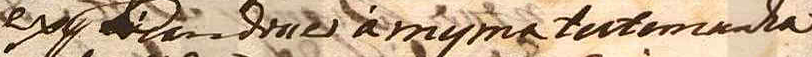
explicandosse á mesma testemunha
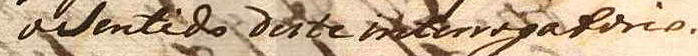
o sentido deste interrogatorio.
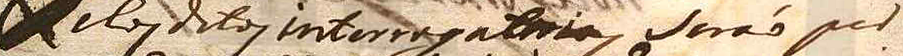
Pelos ditos interrogatorios seraõ per
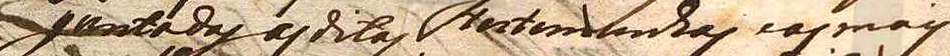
guntadas as ditas testemunhas e as mais
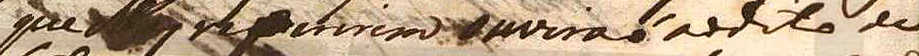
que ellas referirem ouviraõ ao dito de
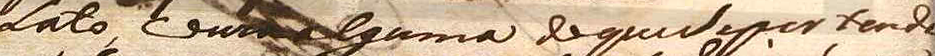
Lato, couza alguma do que se pertende
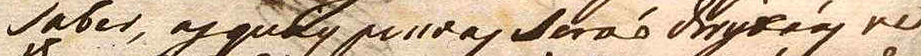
saber, as quais pessoas Seraõ christaās ve
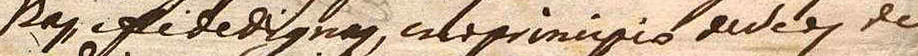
lhas, e fidedignas, e no principio de seos de
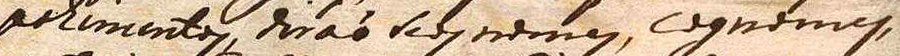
pohimentos, diraõ seos nomes, cognomes,
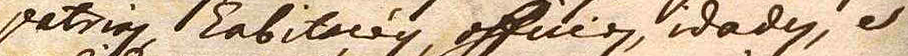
patrias, habitações, officios, idades e
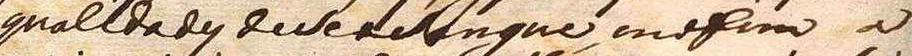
qualidades de seo sangue, e no fim a
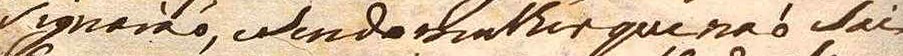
signaraõ, e sendo mulher que naõ Sai
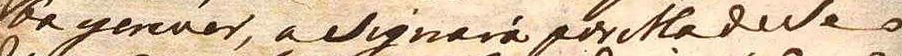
ba escrever, asignará por ella de Seo
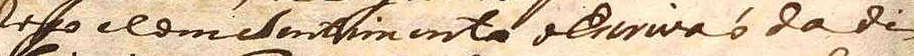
Rogo e comsentimento o Escrivaõ da di
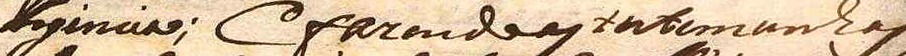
Ligencia; e fazendo as testemunhas,
